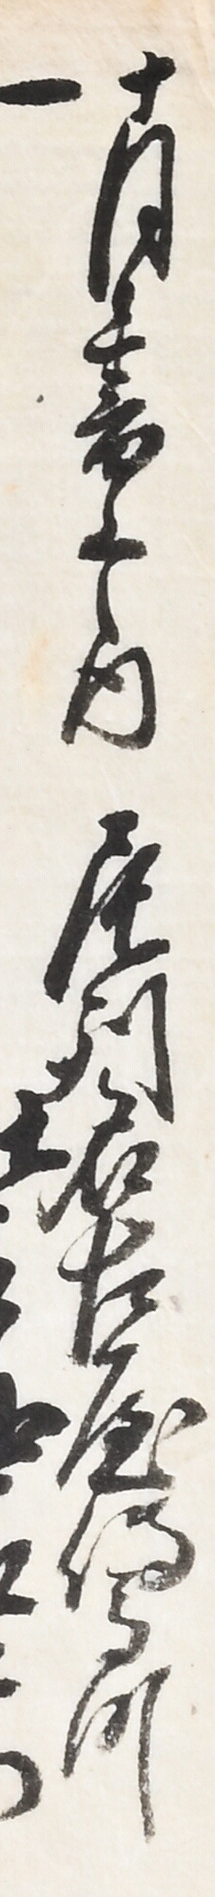十月書上之内尾州名古屋伝馬町
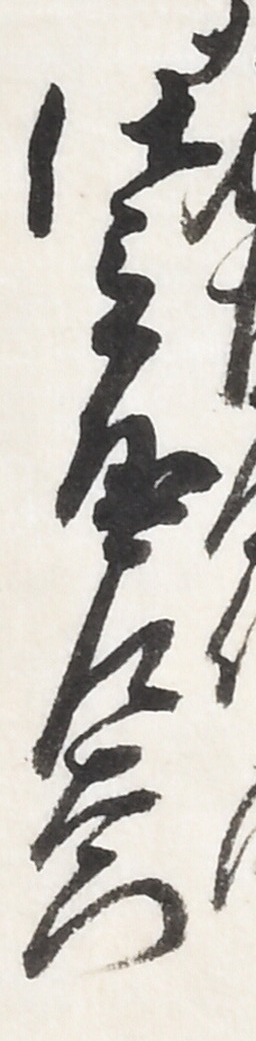一仕立屋左右衛門
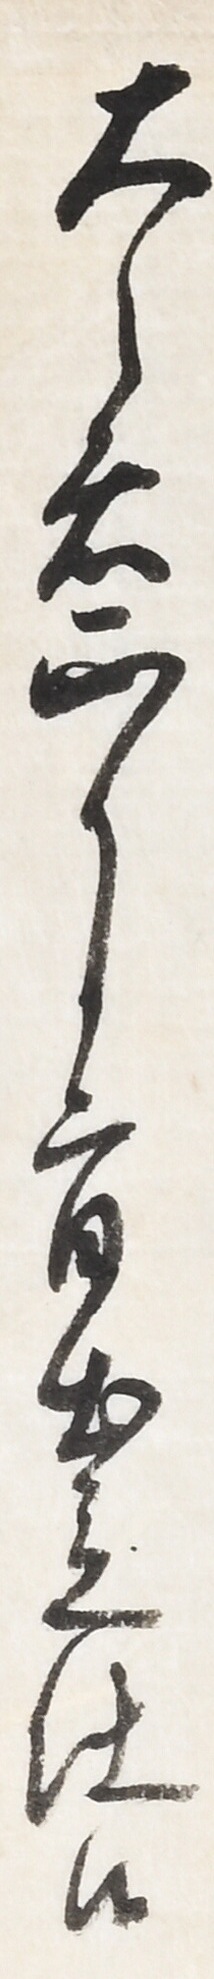右之者正月二日出立仕候
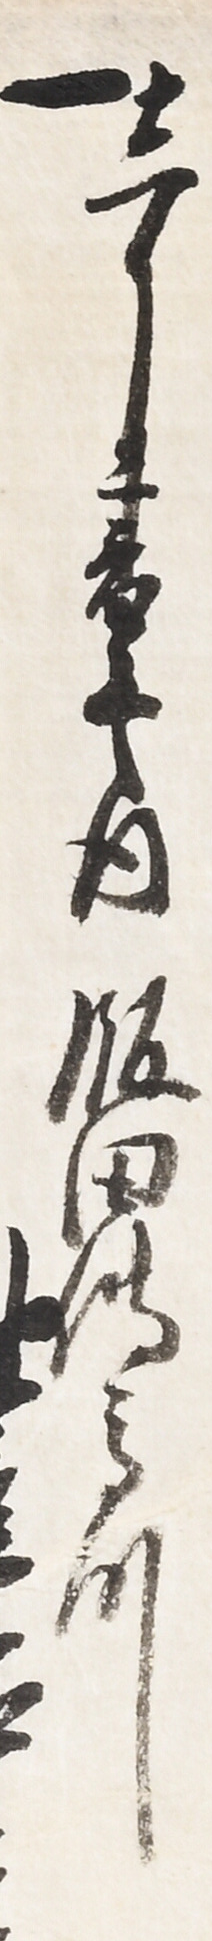十二月書上之者飯田伝馬町
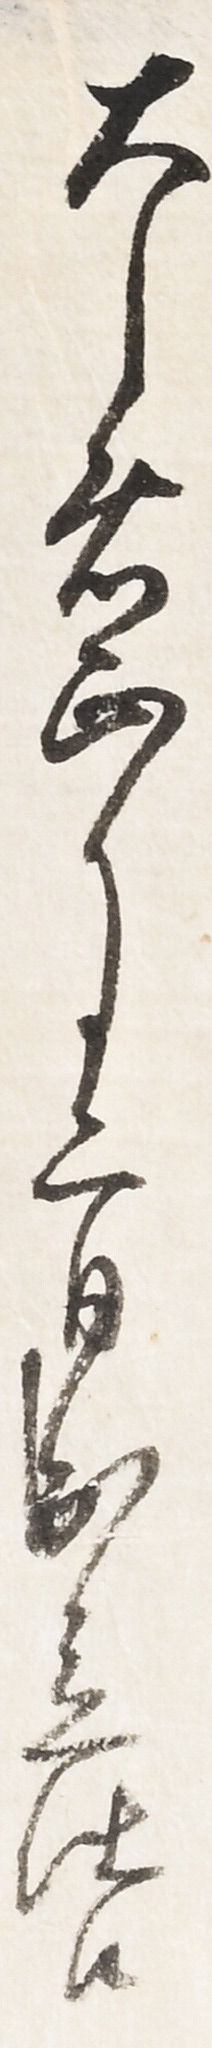右之者正月二日出立仕候
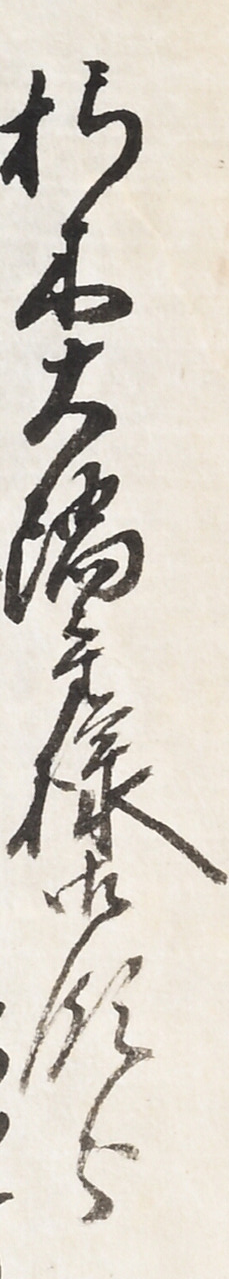朽木大隅守様御領分
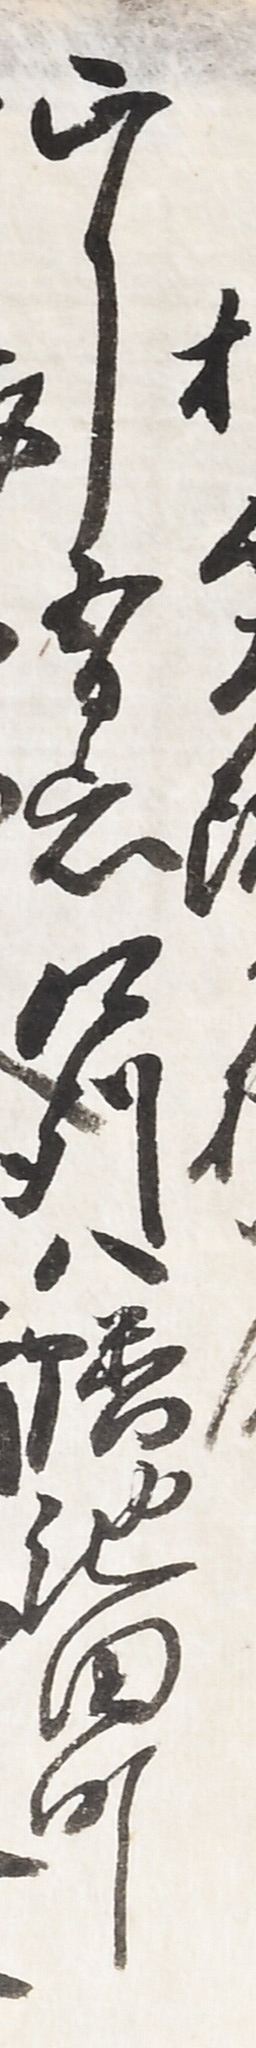正月五日着江州八幡池田町
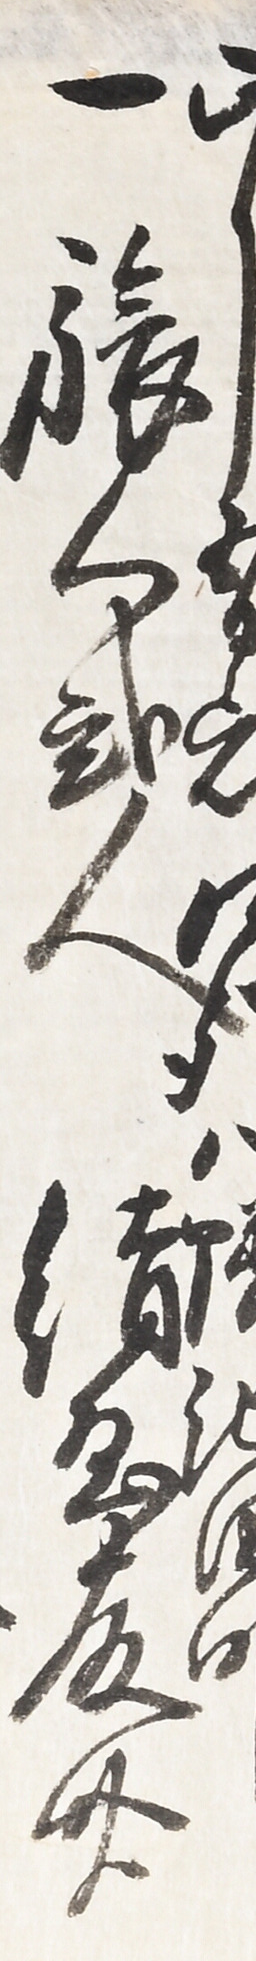一旅人弐人絹屋籐介
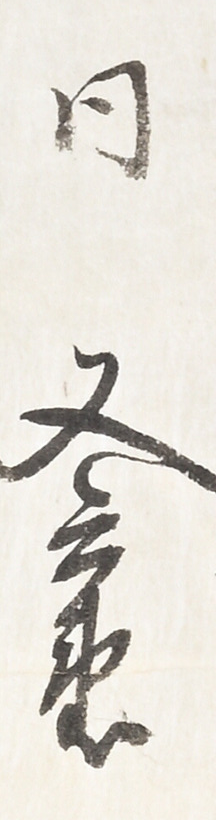同又兵衛
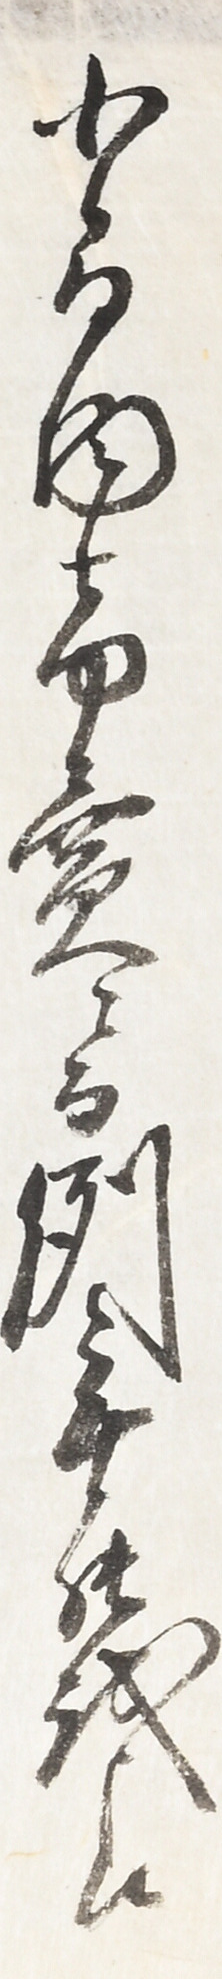小間物商売ニ而例年罷越申候
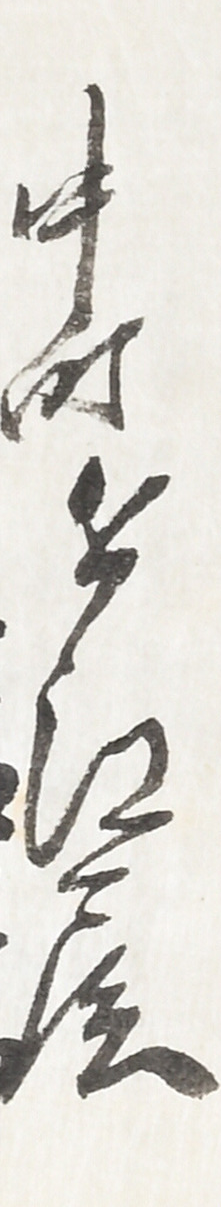中町近江屋
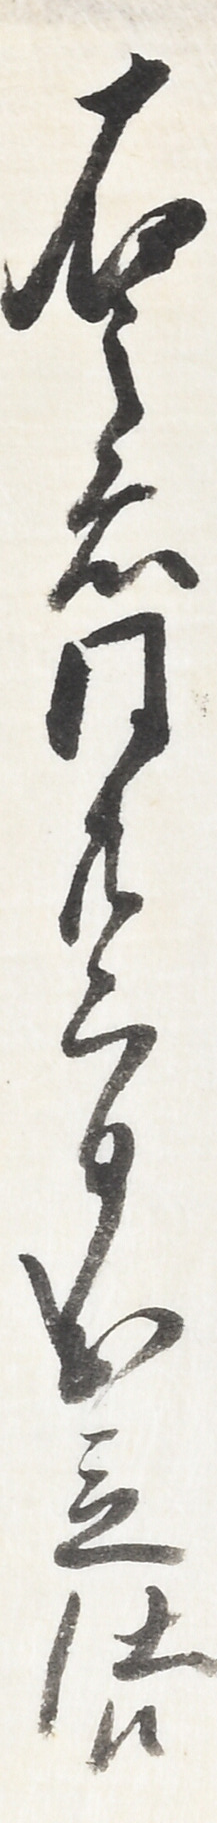右之者同廿二日出立仕候
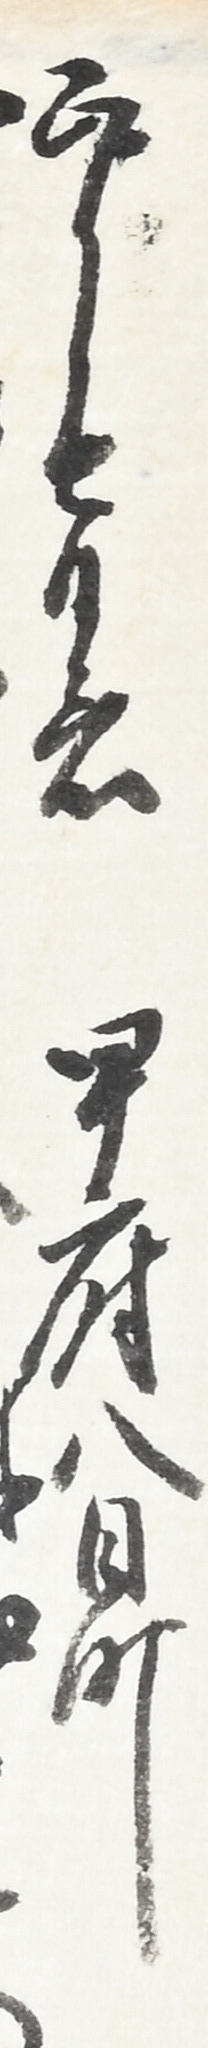正月七日着甲府八日町
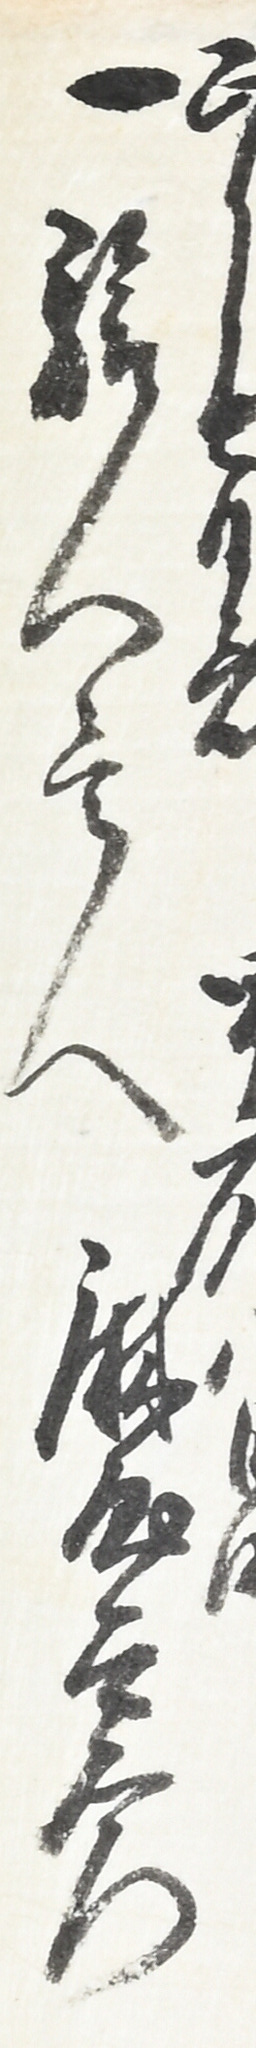一旅人壱人麻屋太右衛門
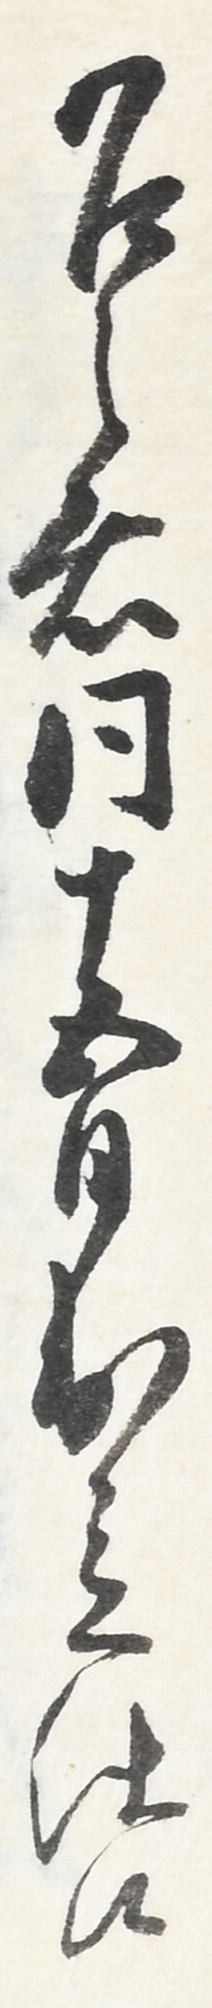右之者同廿二日出立仕候

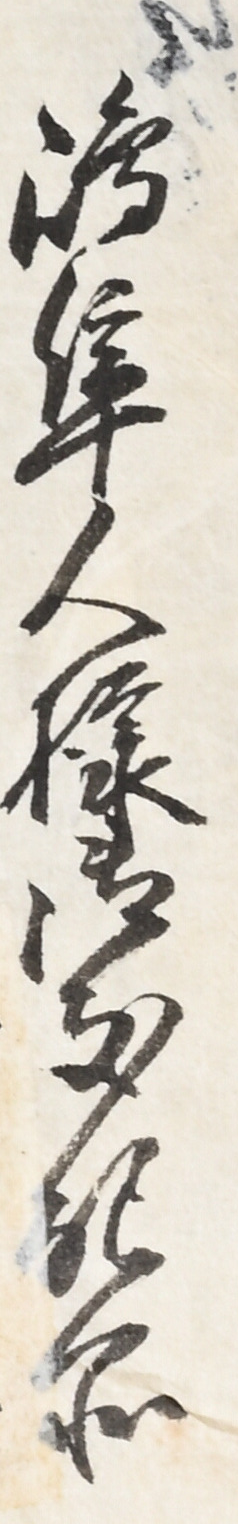嶋隼人様御支配所
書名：旅人泊控帳
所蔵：伊那市立高遠町図書館・合同会社AMANE
